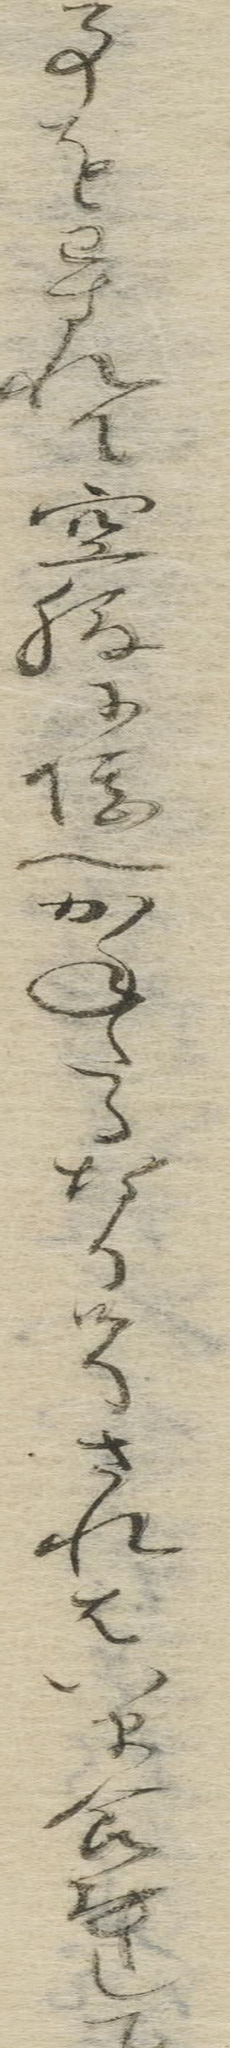事をわすれて空腹に堪へかねたるなりけりされはいま食事して
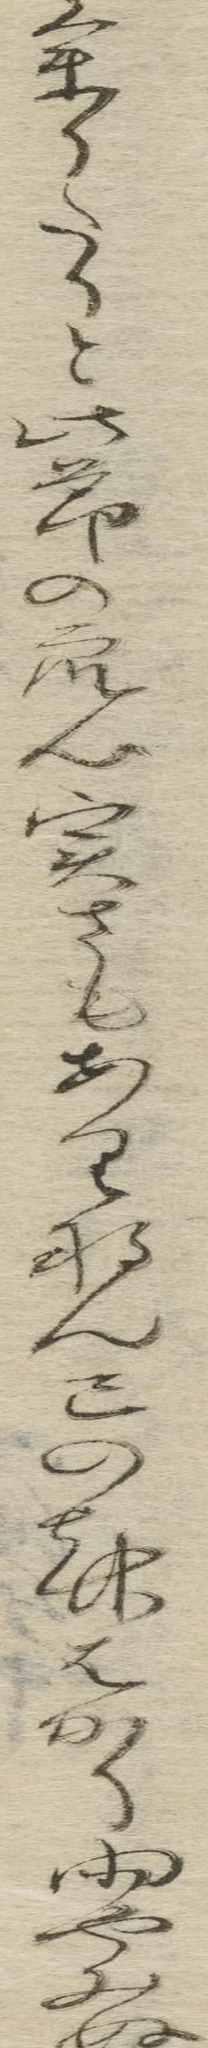参りたりと此節の衆人突さもありなん巳の刻はかり雨やみぬ
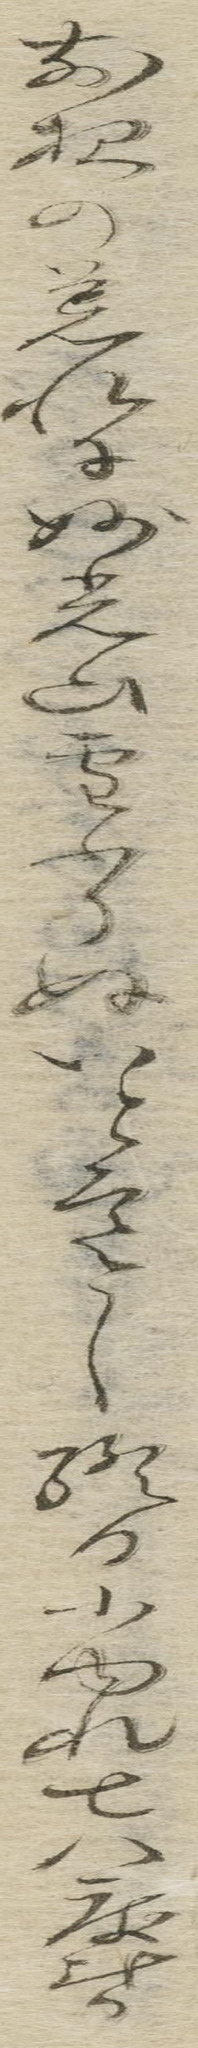前夜の荒れに妙光山雪ふりぬいと寒し終日小ゆれ七八度計り
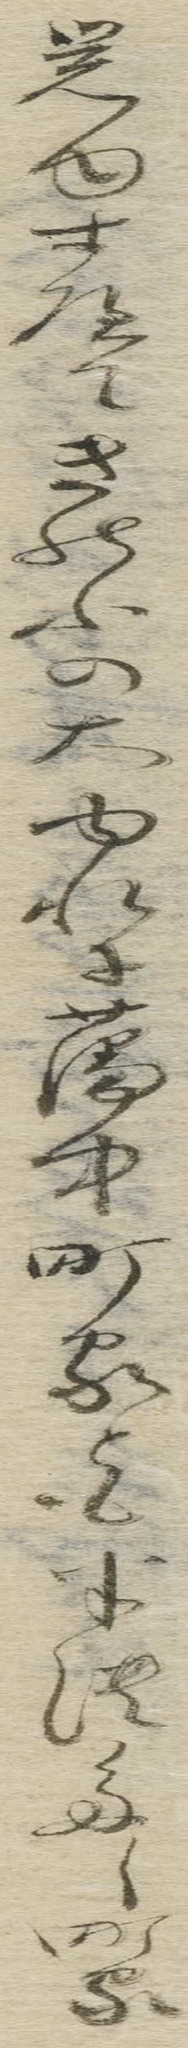覚ゆすへてきのふの大ゆれに藩中町家とも半潰多し町家
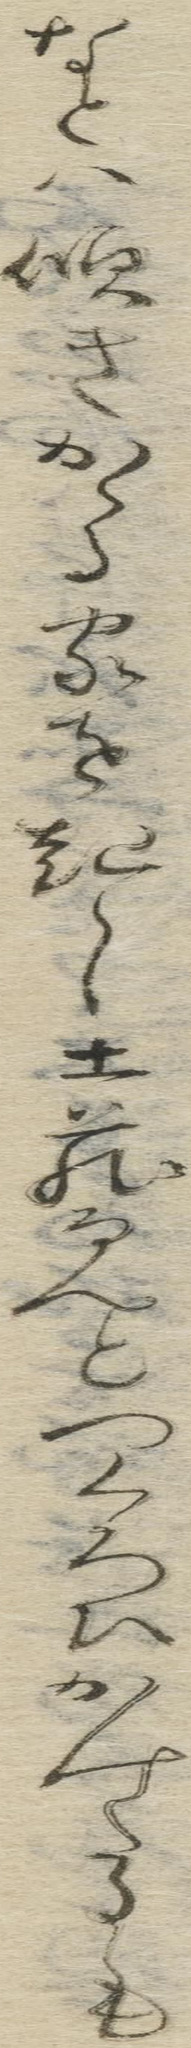なとハ傾きかゝる家を起し土蔵なんとつくろひかけたるも
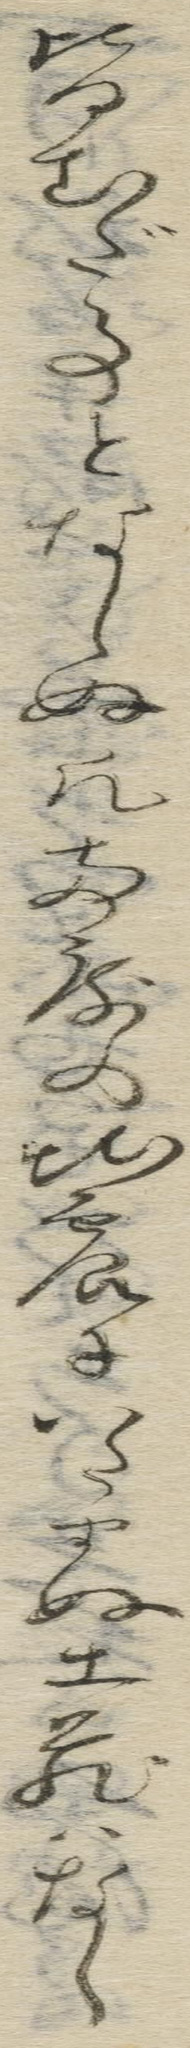皆むだ事となしぬ凡両度の地震にいたまぬ土蔵ハなし
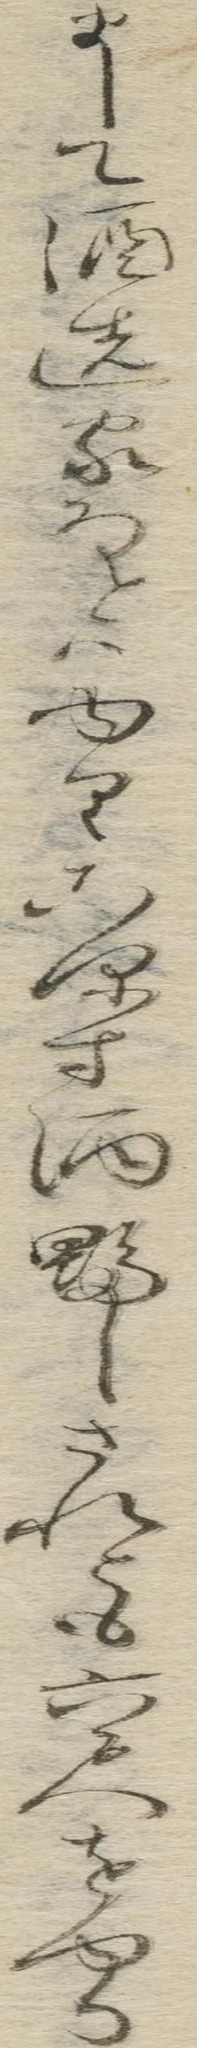まして酒造家なとハゆりこほす酒夥しされとも六尺をゆり
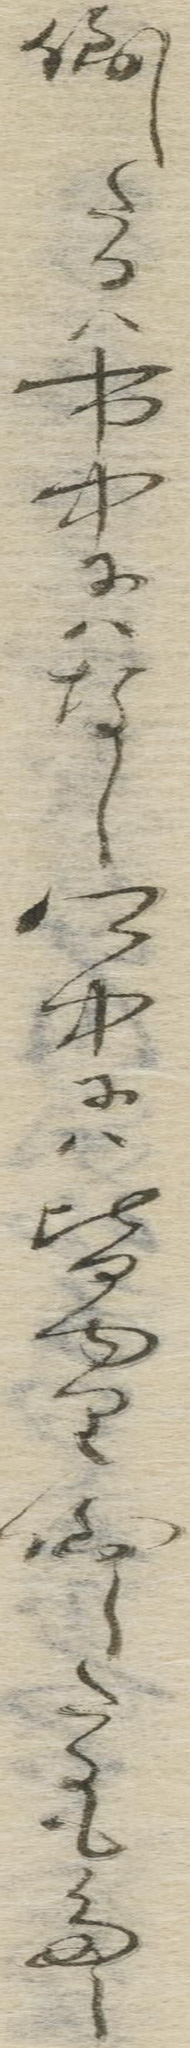倒したるハ市中になし郷中にハ皆ゆり倒したるも多し
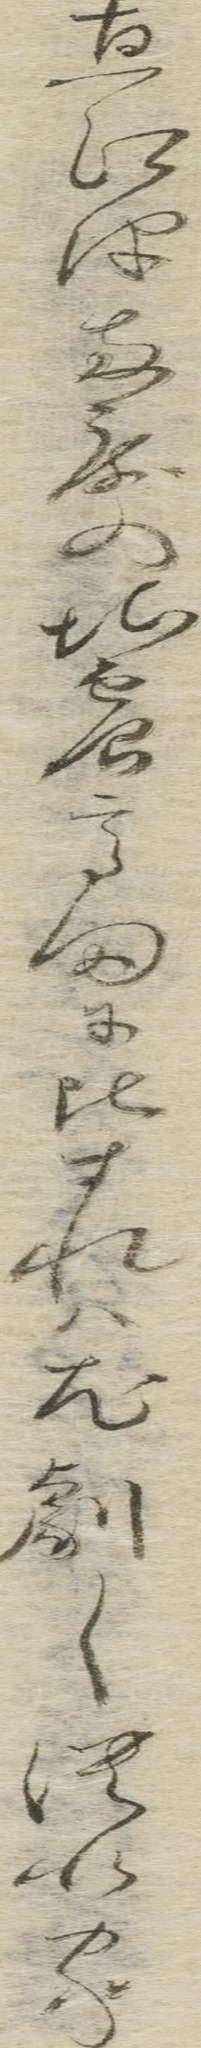直江津両度の地震高田に比すれハ尤劇し潰れ屋
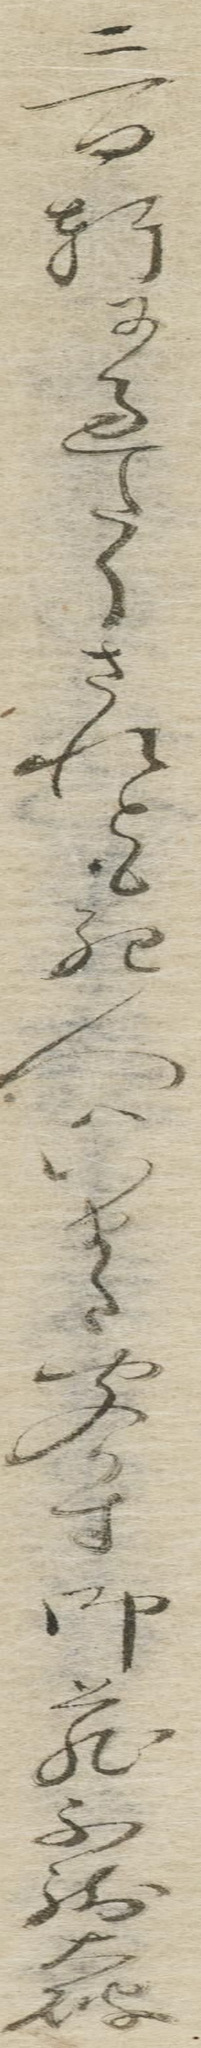二百軒に過たりされとも死人ハいまた聞かす御蔵不残大破
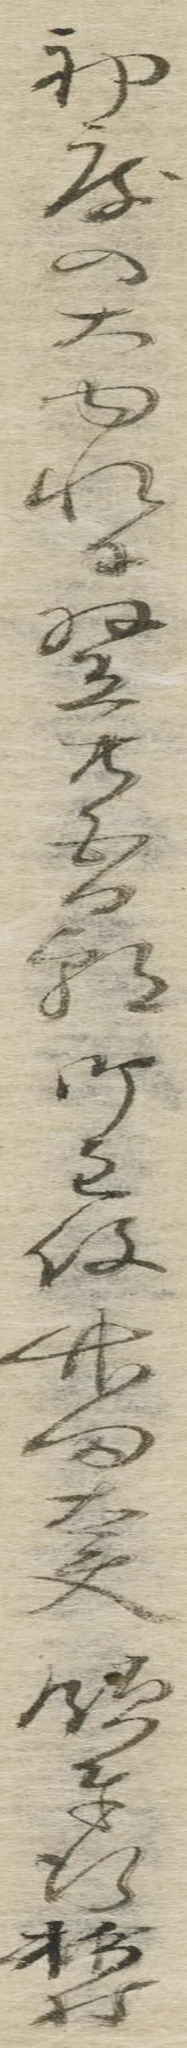初度の大ゆれに翌廿五日朝御過役竹田太夫賄奉行杉村
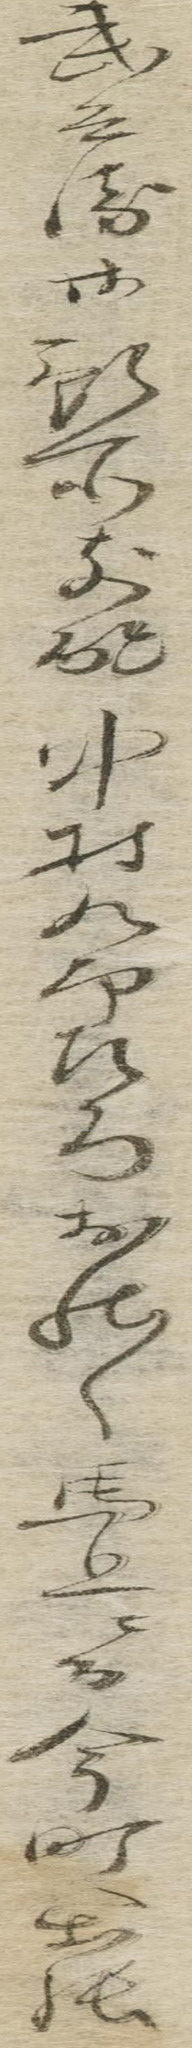武兵衛御預所支配中村八郎左衛門おの〳〵馬立二而今町へ出張
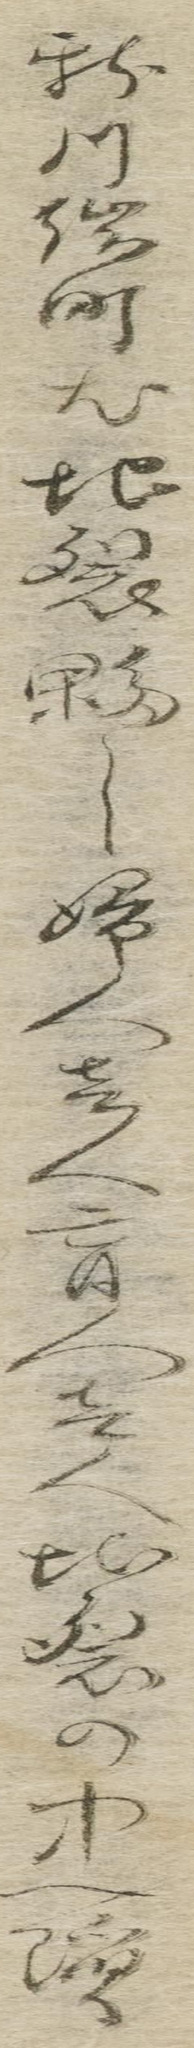新川潟町尤地裂夥し婦人壱人盲人壱人地裂の中へ陥る
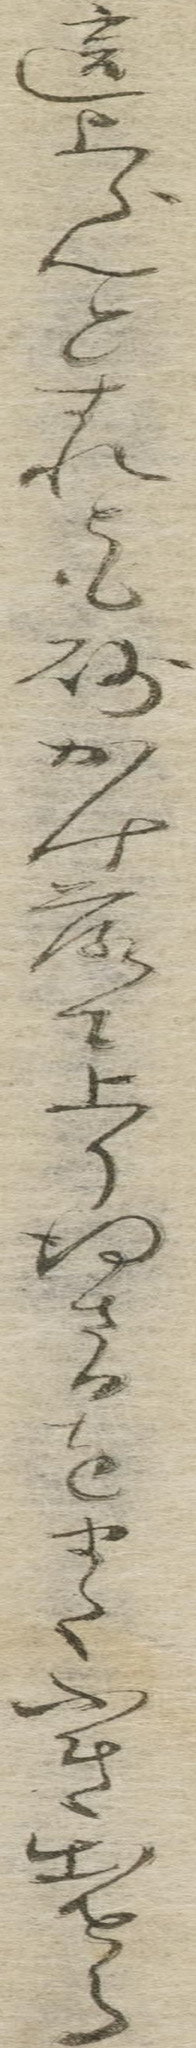這上らんとすれとも砂かけ落て上りえさるをまたふき出ける
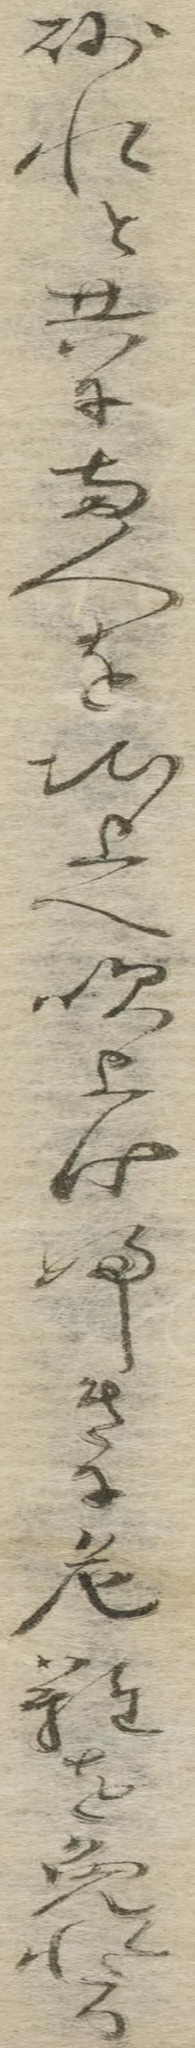砂水共に両人を地上へ吹上ふしきに危難を免れる

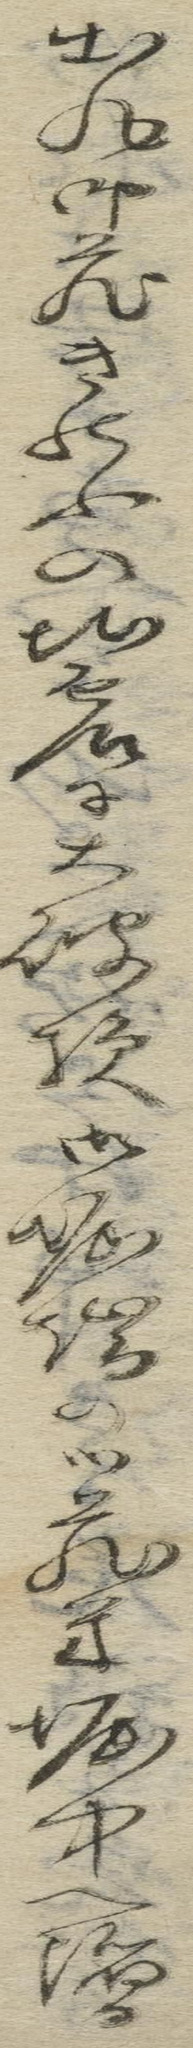出丸御蔵きのふの地震に大破損御堀端の御蔵米堀中へ陥る
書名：弘化丁未天變日記
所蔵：東京大学地震研究所図書室 Earthquake Research Institute Library, The University of Tokyo, JAPAN
